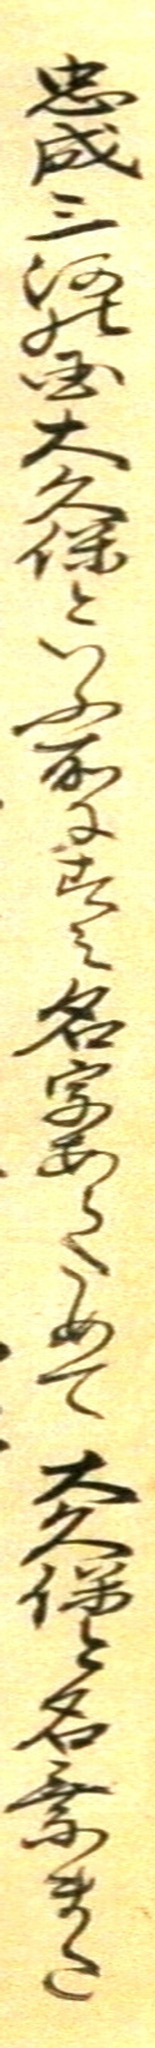忠成三河の国大久保といふ所にすみ名字あらためて大久保と名乗また
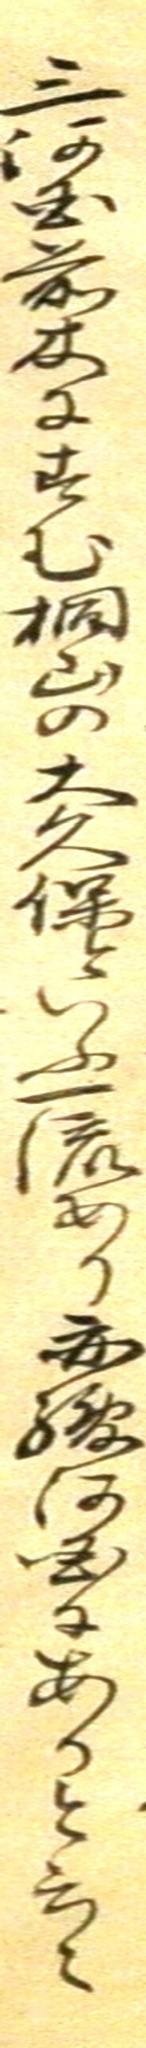三河国前木にすむ桐山の大久保といふ一流あり亦駿河国にありと云々
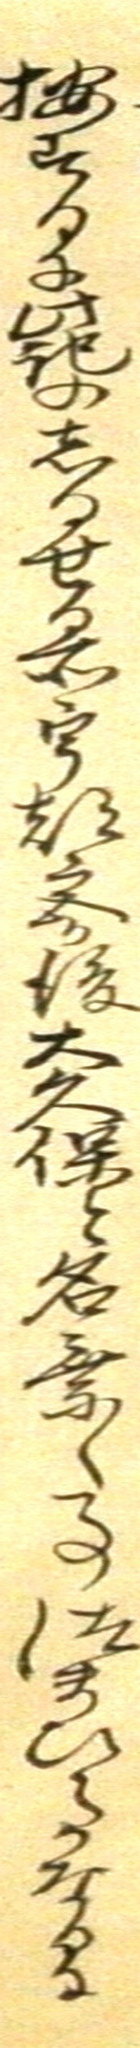按するに此記のしるせる所宇都宮か後大久保と名乗候事つまひらかなるに
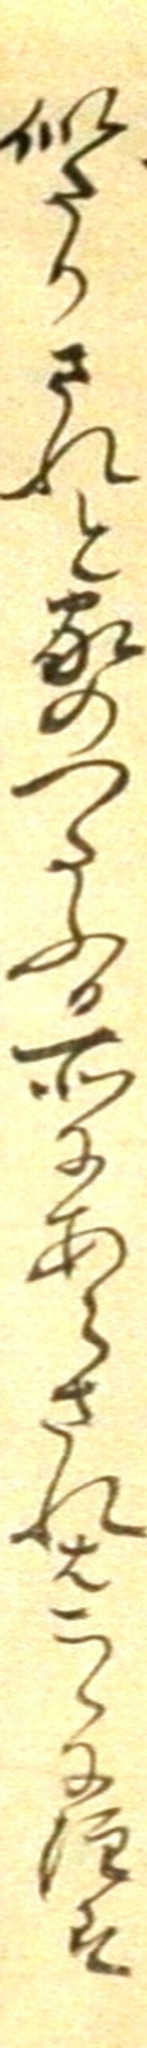似たりされと家のつたふる所にあらされはこゝに注す
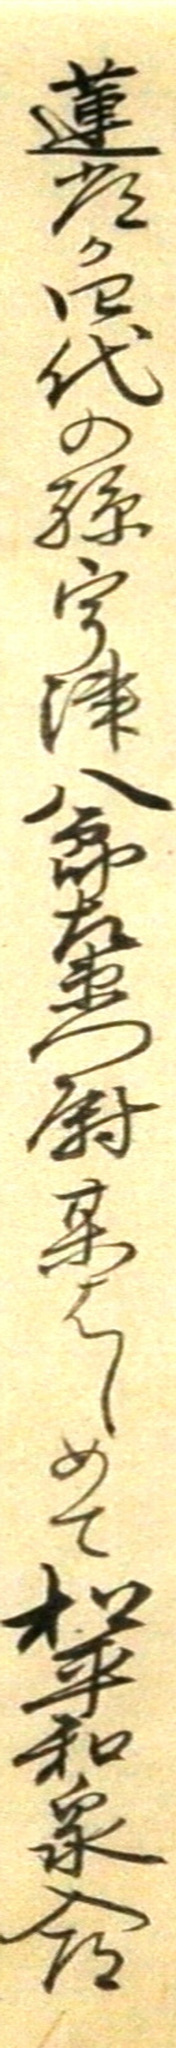蓮常か四代の孫宇津八郎左衛門尉某はしめて松平和泉入道
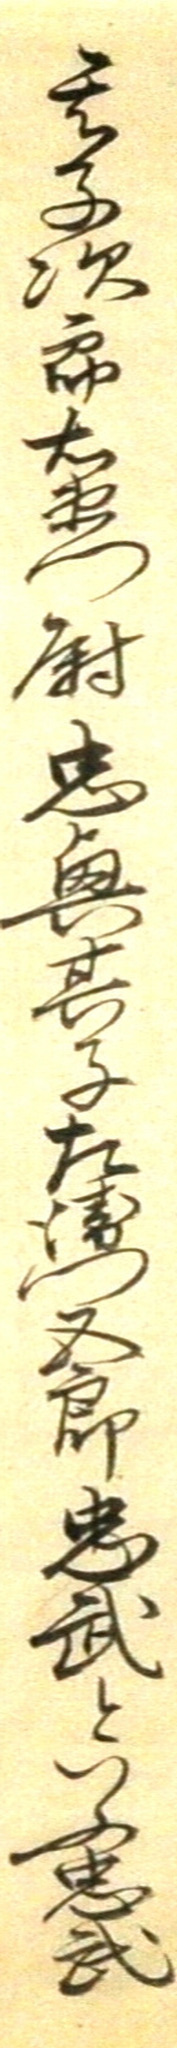其子次郎右衛門尉忠興其子左衛門五郎忠武といふ忠武
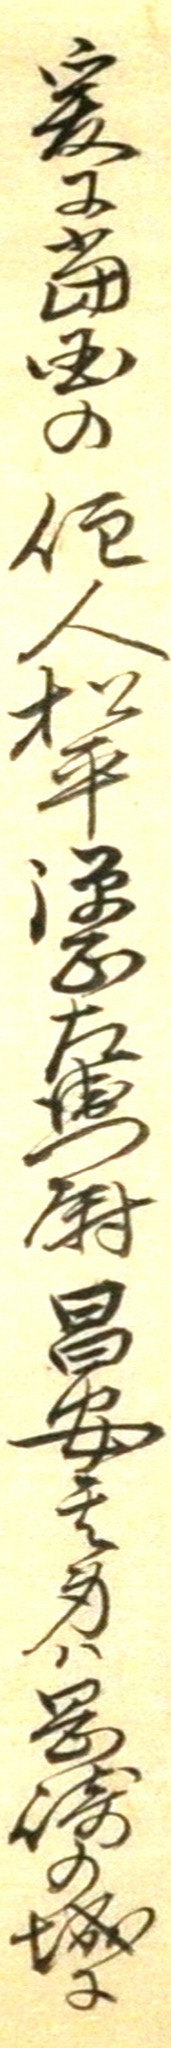爰に当国の住人松平弾正左衛門尉昌安其身は岡崎の城に
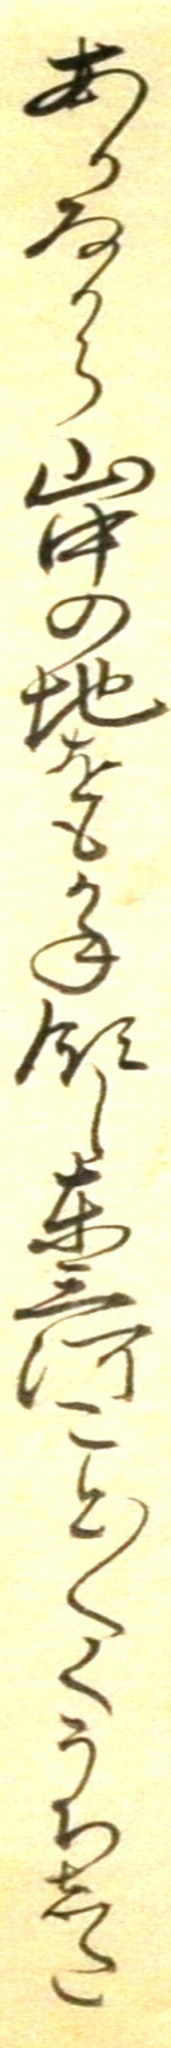ありなから山中の地をもかね領し東三河こと〳〵くうちした
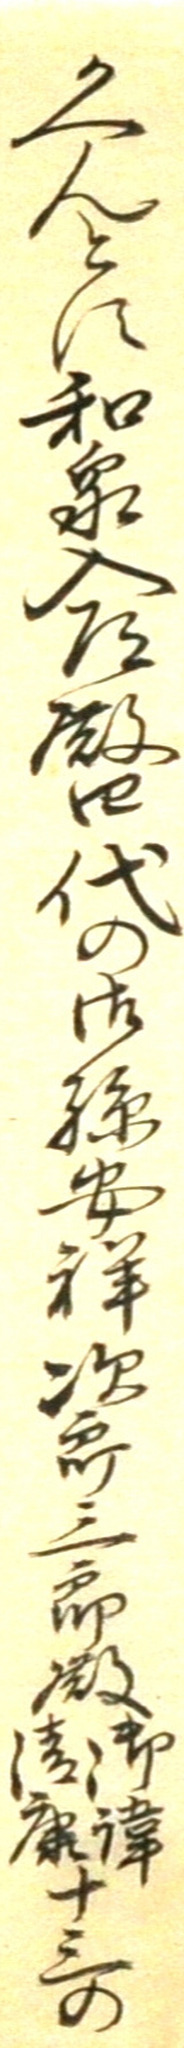かへんとす和泉入道殿四代の御孫安祥次郎三郎殿御諱清康十三の
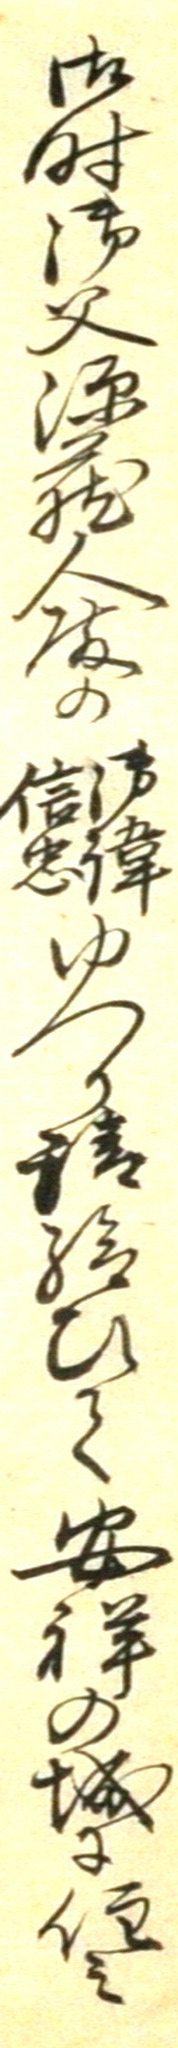御時御父源蔵人殿の御諱信忠ゆつり請給ひて安祥の城に住み
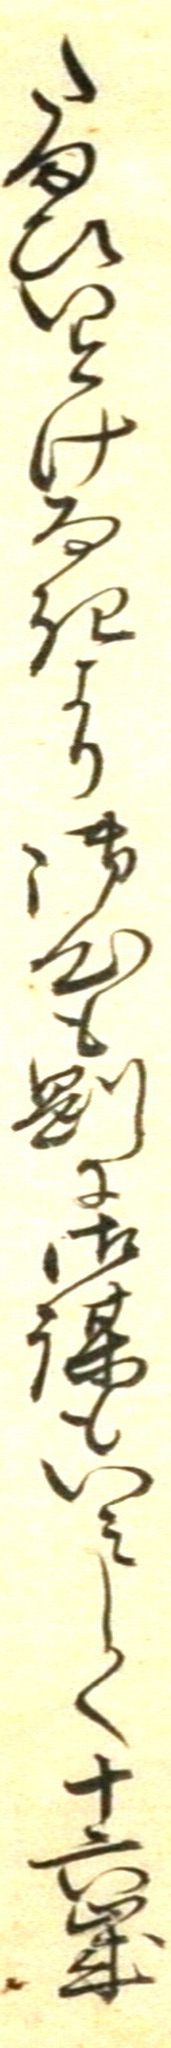たまひいとけなきより御心も剛に御謀もいみしく十六歳
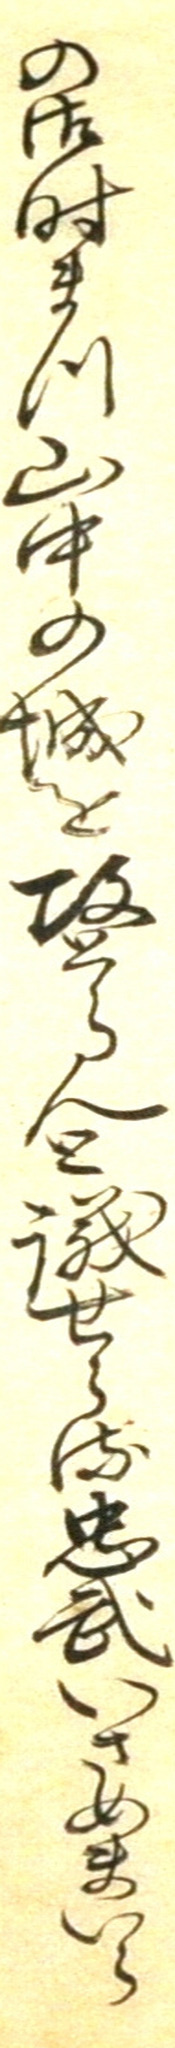の御時まつ山中の城を攻とらんと議せらる忠武いさめまいら
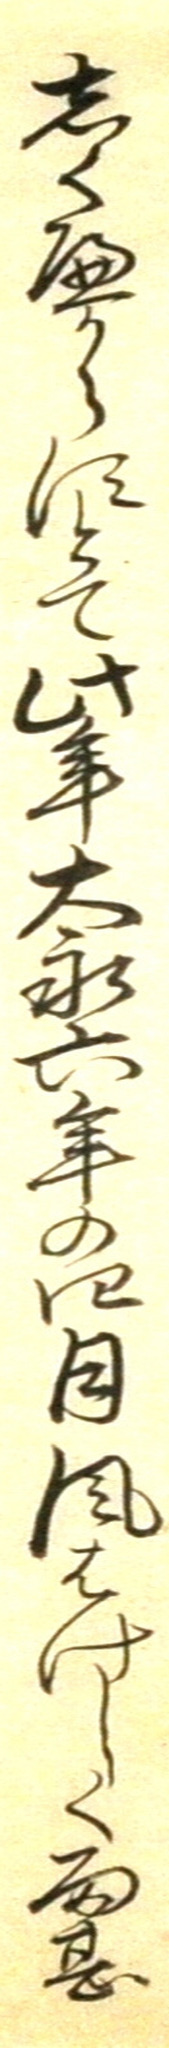しくへからすとて此年大永六年の四月風はけしく雨甚
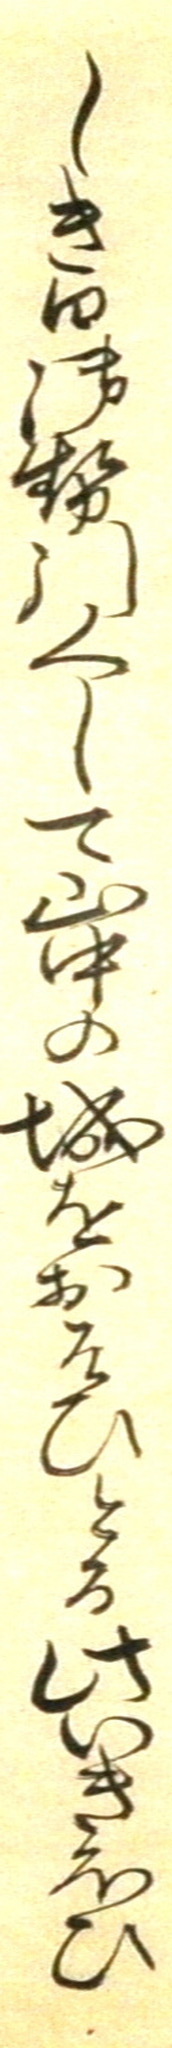しき日御勢引くして山中の城をおそひとる此いきほひ
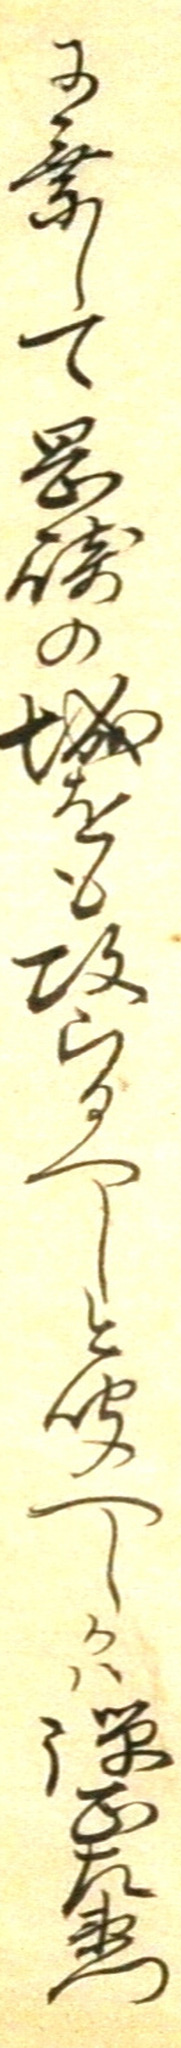に乗して岡崎の城をも攻らるへしと聞へしかは弾正左衛門
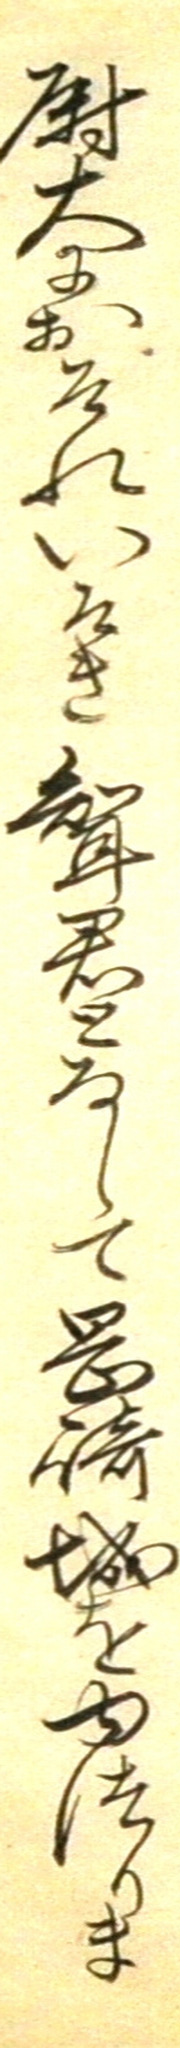尉大におそれいそき聟君となして岡崎城をゆつりま
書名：藩翰譜（四・中）
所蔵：伊那市立高遠町図書館・合同会社AMANE
